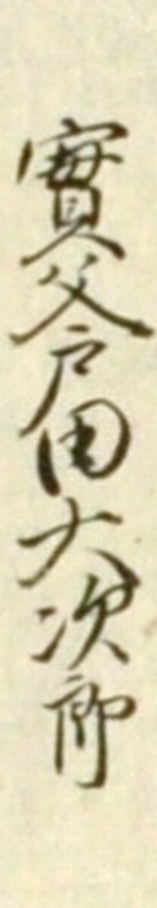實父戸田大次郎
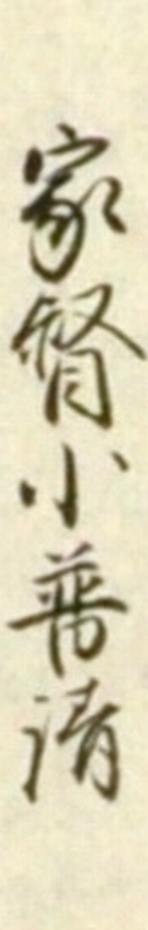家督小普請
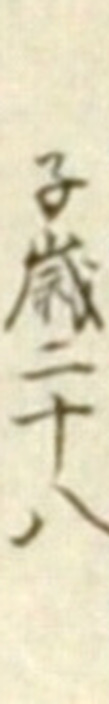子歳二十八
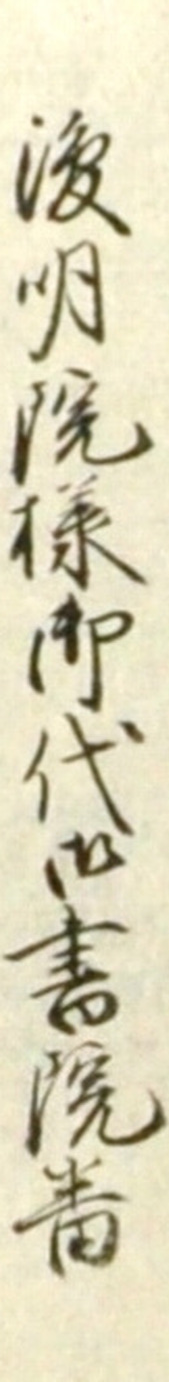浚明院様御代御書院番
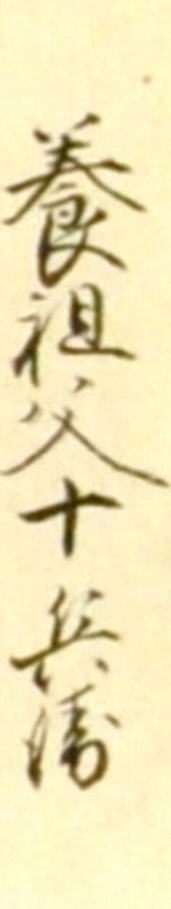養祖父十兵衛
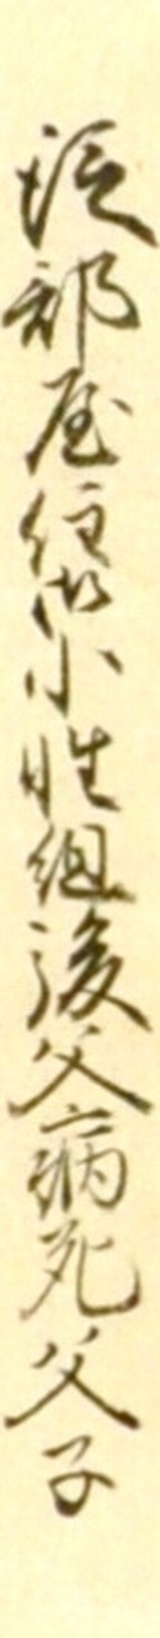従部屋住御小姓組後父病死父子
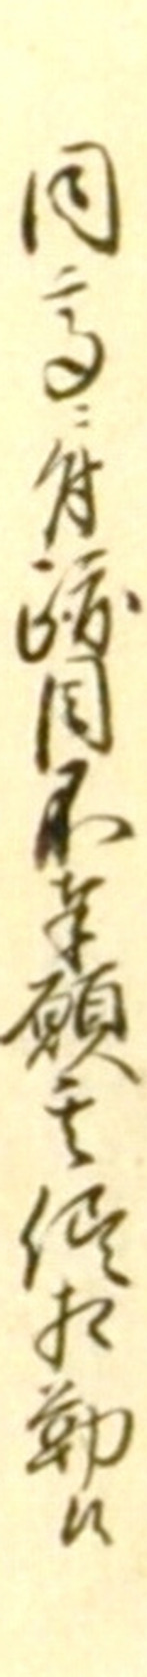同高ニ付跡目不奉願其侭相勤候
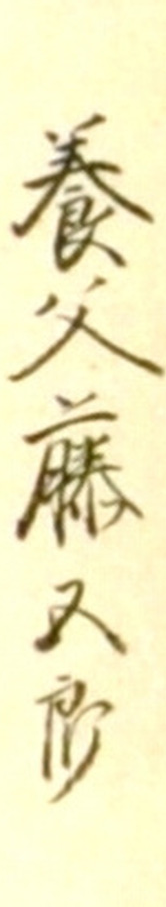養父藤五郎

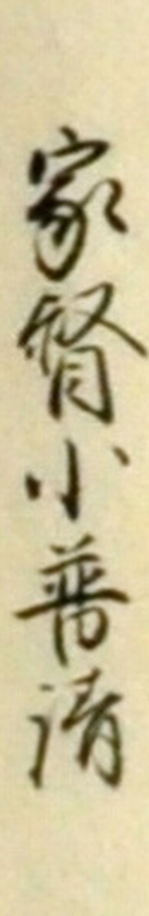家督小普請
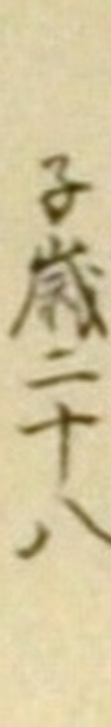子歳二十八
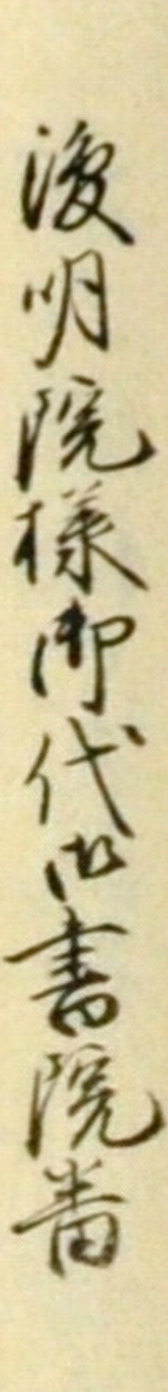浚明院様御代御書院番
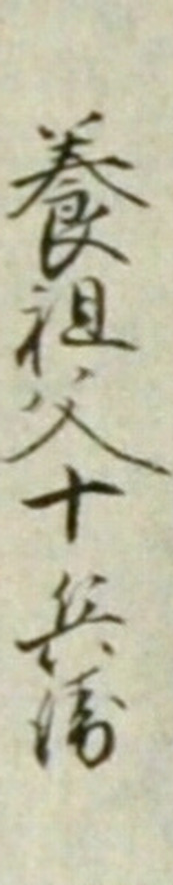養祖父十兵衛
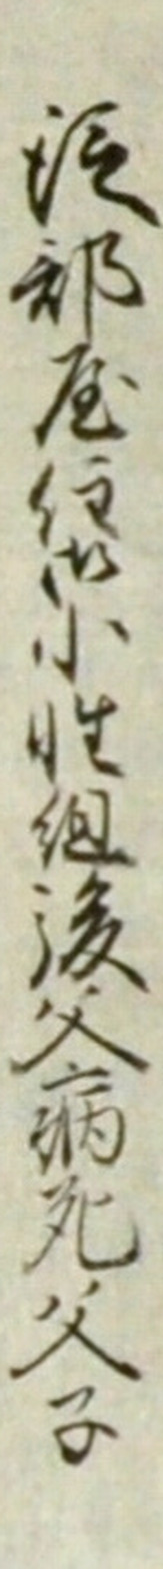従部屋住御小姓組後父病死父子
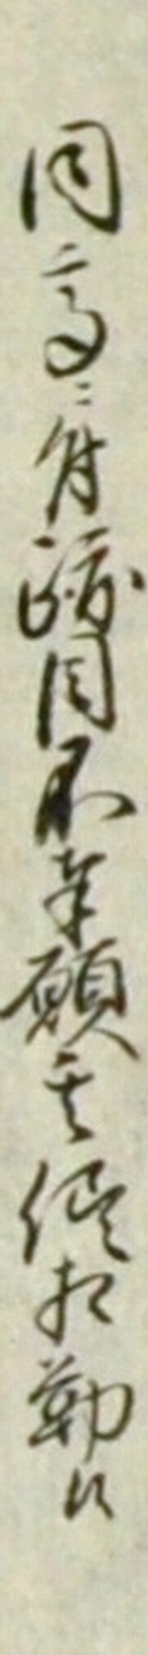同高ニ付跡目不奉願其侭相勤候
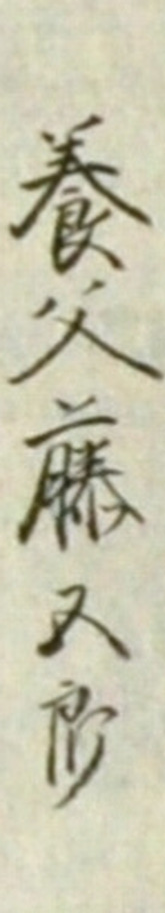養父藤五郎
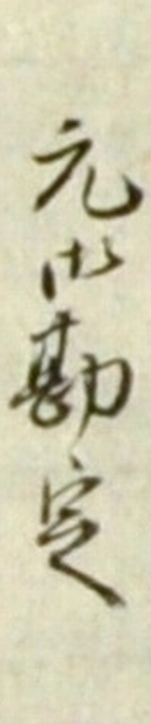元御勘定
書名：若年寄御役中御調書付
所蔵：伊那市立高遠町図書館・合同会社AMANE
